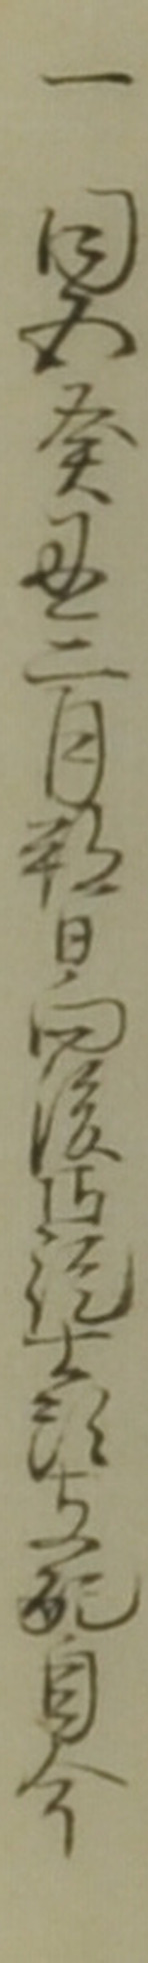一同五壬癸丑三月朔日向後御徒士頭支配自今
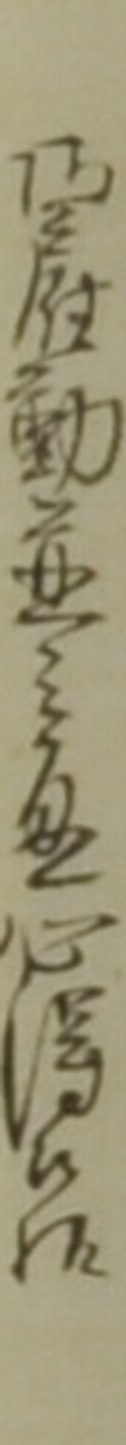御雇勤並之通心得候様
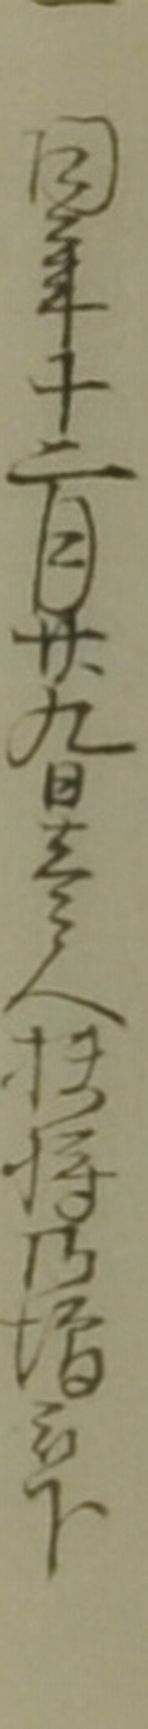一同年十二月廿九日壱人扶持御増被下

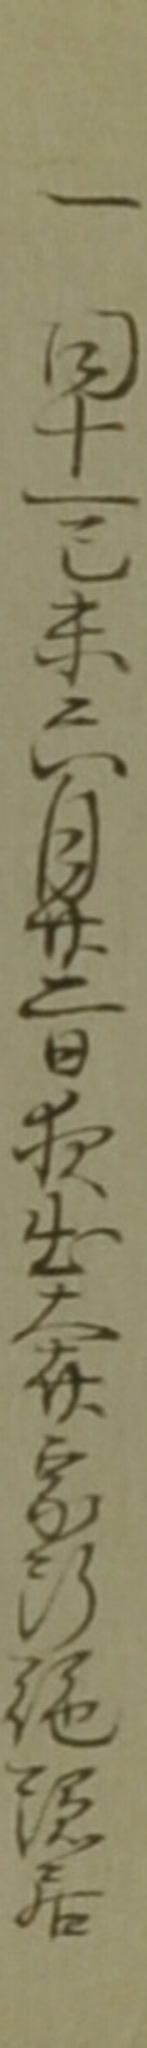一同十一己未六月廿二日夜出奔家断絶隠居
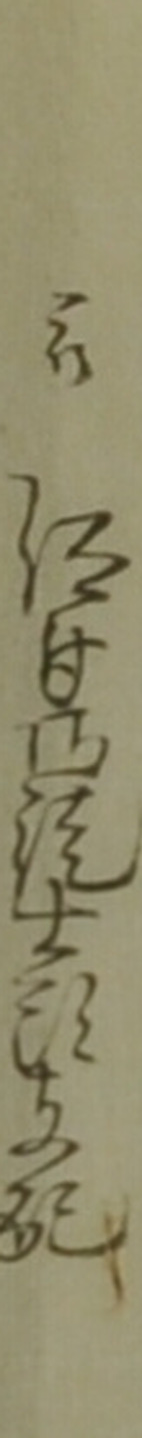被仰付御徒士頭支配
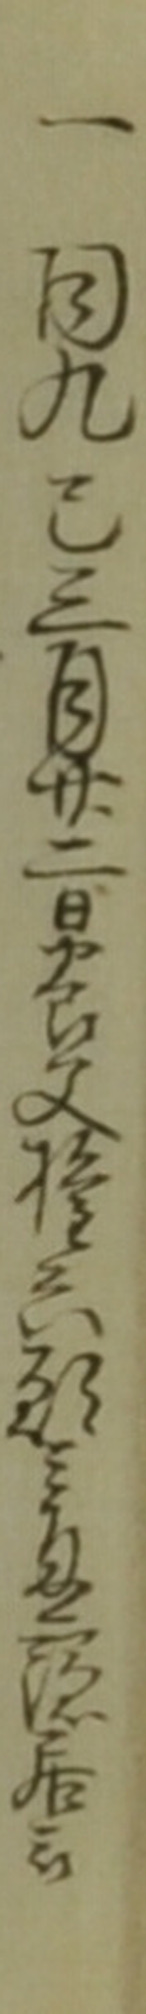一同九巳三月廿二日養父権六願之通隠居被
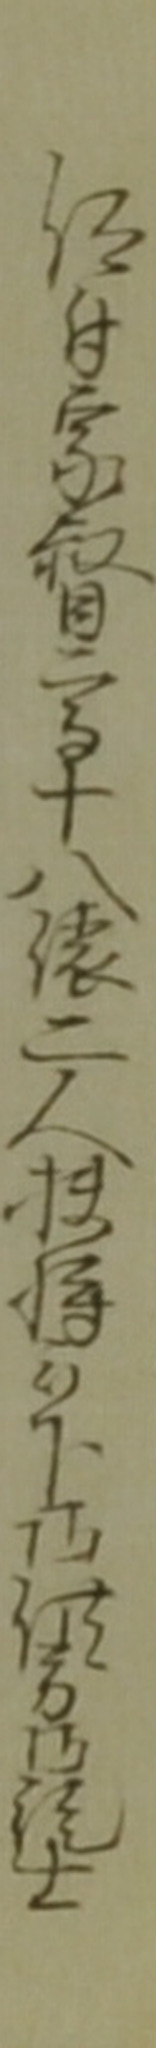仰付家督高十八俵二人扶持被下御供方御徒士
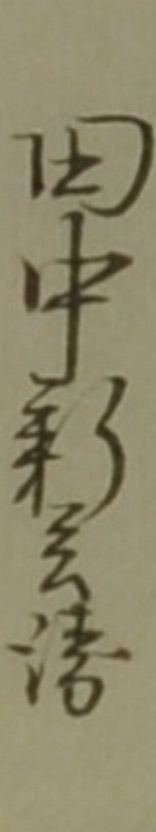田中新兵衛
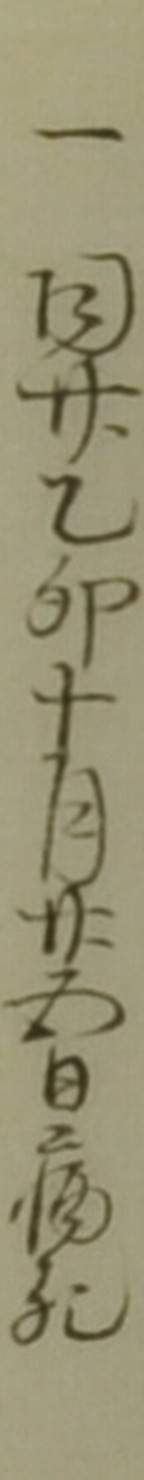一同廿乙卯十月廿五日病死

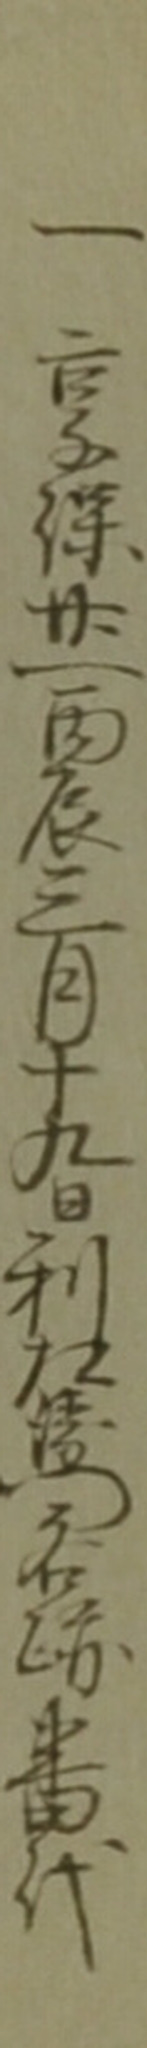一享保廿一酉辰三月十九日利左衛門拿名跡番代
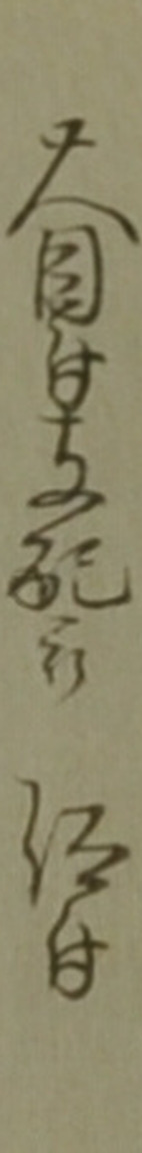大目付支配被仰付
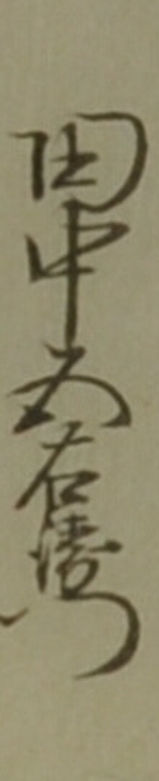田中五右衛門
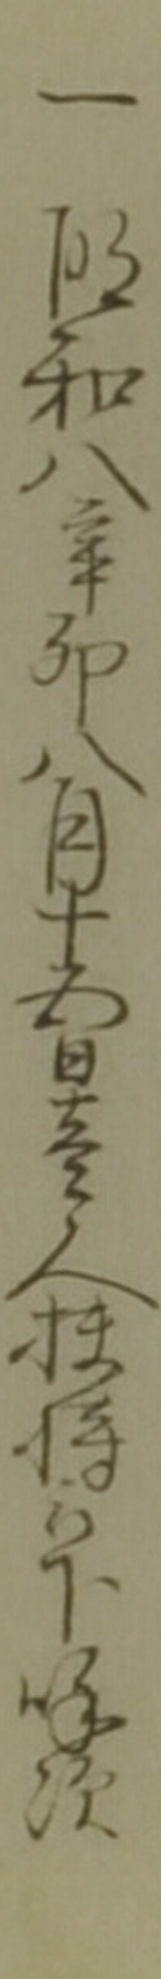一明和八辛卯八月十五日壱人扶持被下呼次
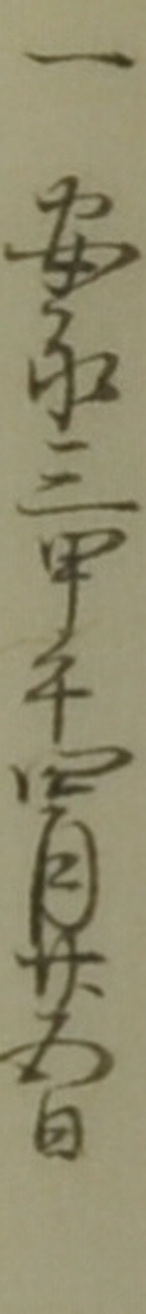一安永三甲午四月廿五日
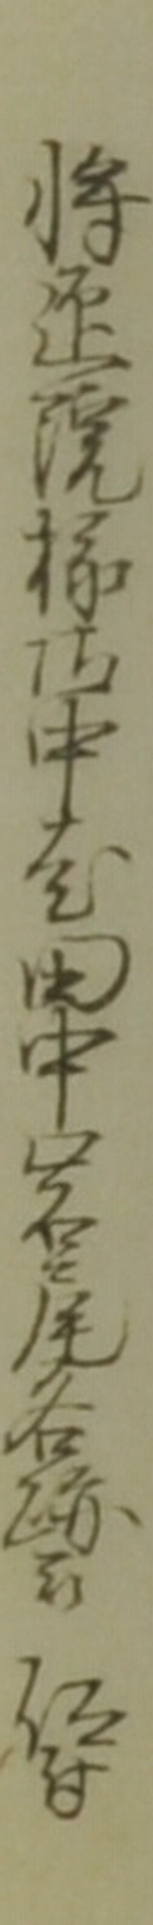将迎院様御中老田中岩尾名跡被仰付
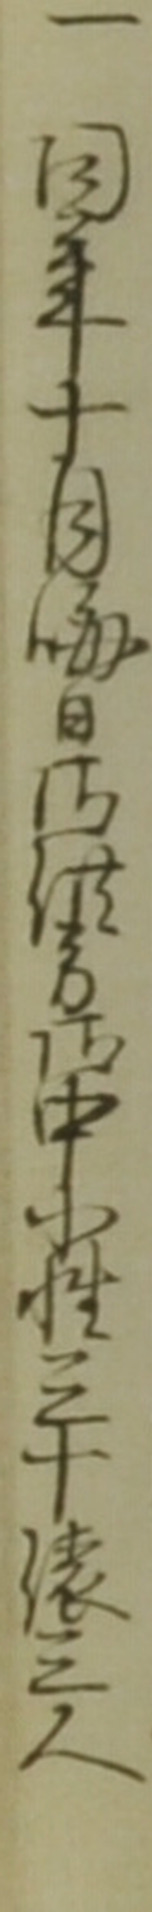一同年十月晦日御供方御中小性三十俵三人
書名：無足廃家（壱）
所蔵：伊那市立高遠町図書館・合同会社AMANE
